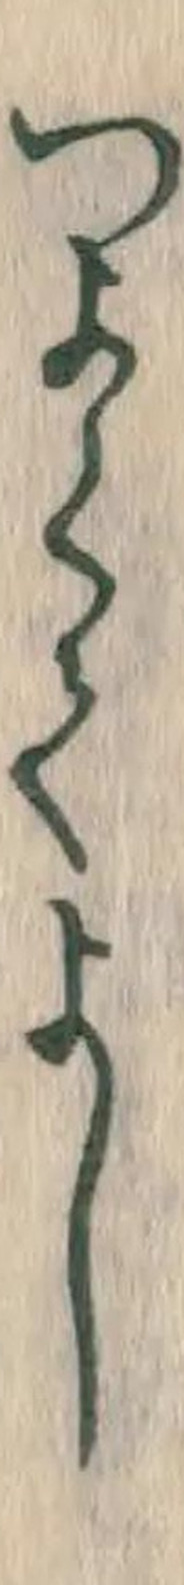つよくてよし
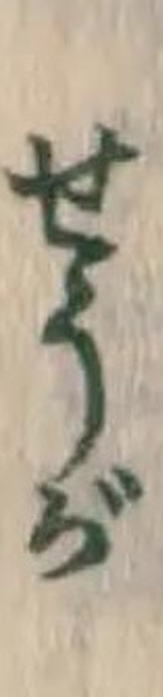せうが
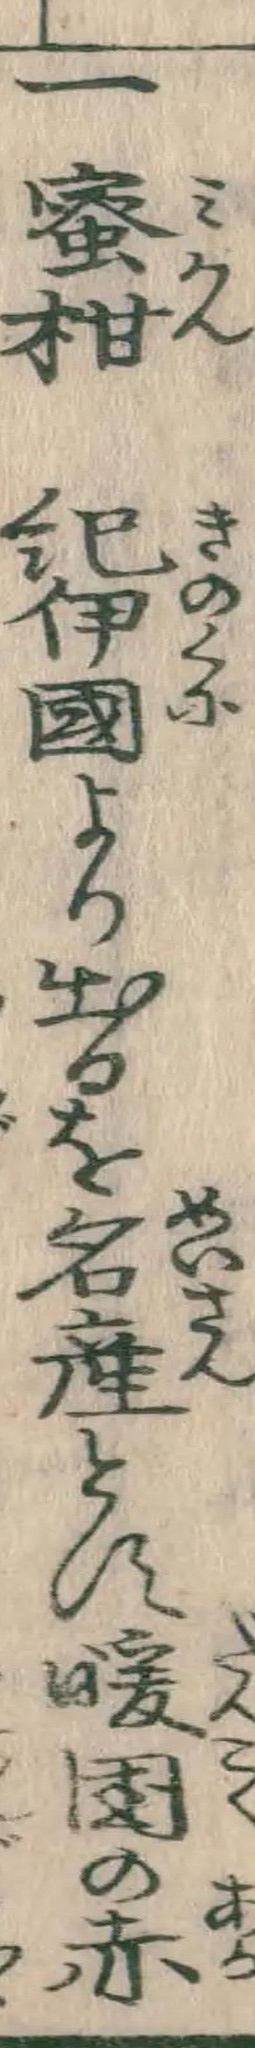一蜜柑紀伊国より出るを名産とす暖国の赤
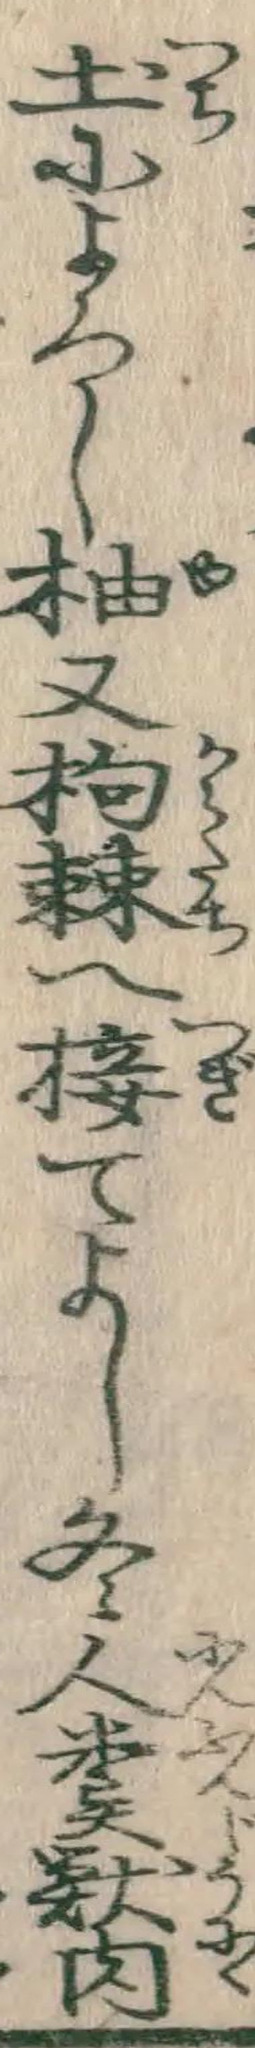土によろし柚又枸棘へ接てよし冬人糞獣肉
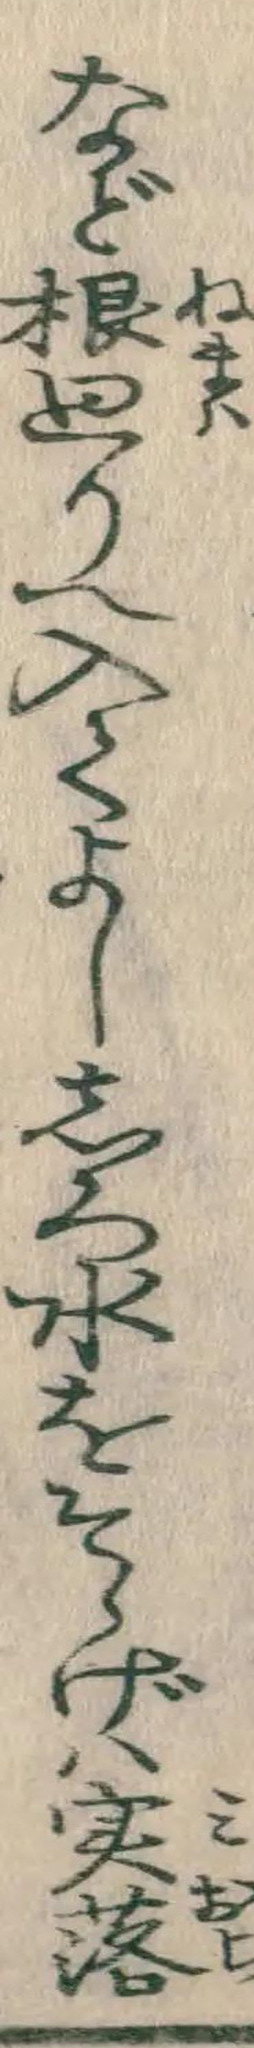など根廻りへ入てよししろ水をそゝげは実落
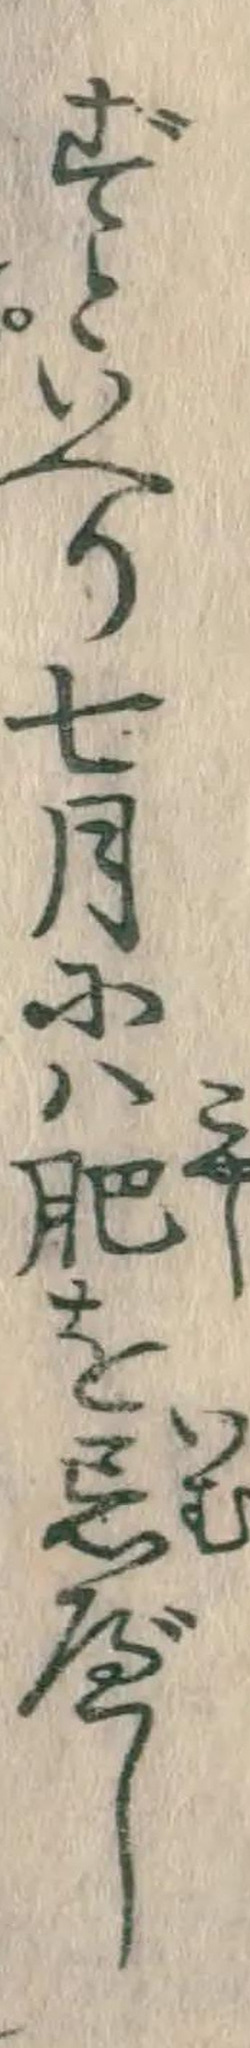ずといへり七月には肥を忌べし
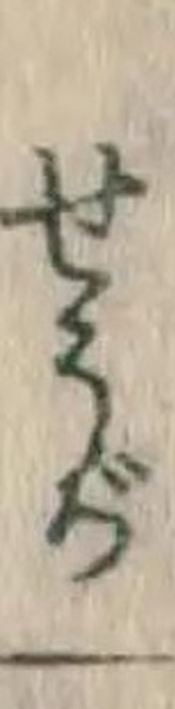せうが
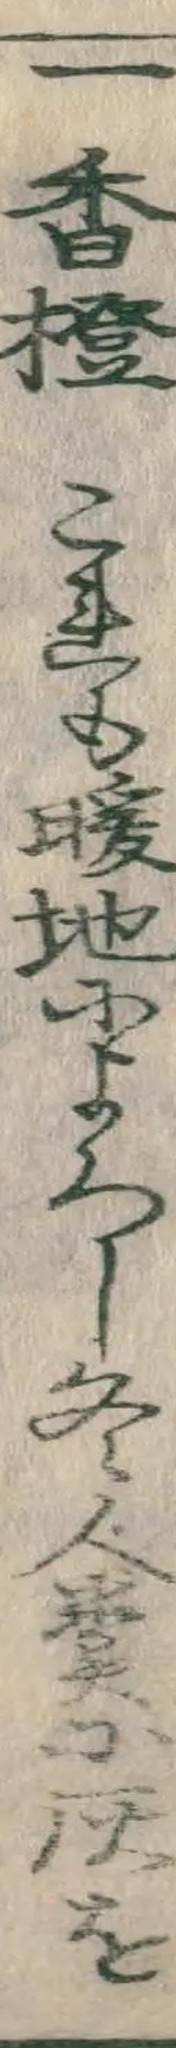一香橙これも暖地によろし冬人糞に灰を
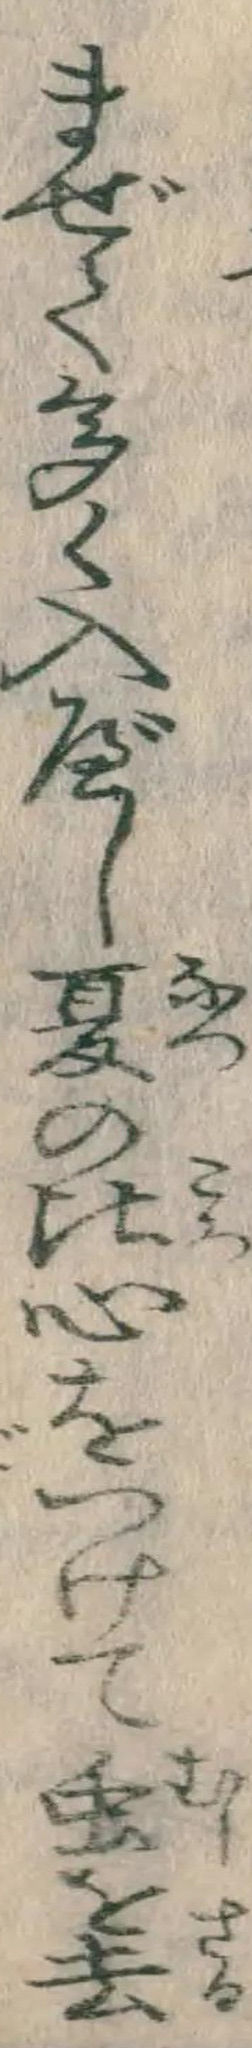まぜて多く入べし夏の比心をつけて虫を去
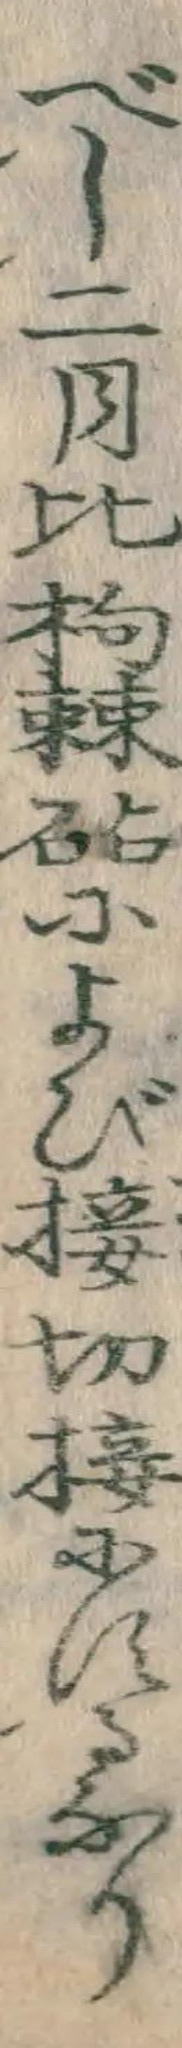べし二月比枸棘砧によび接切接にするなり
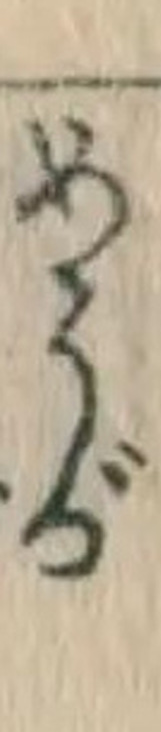せうが
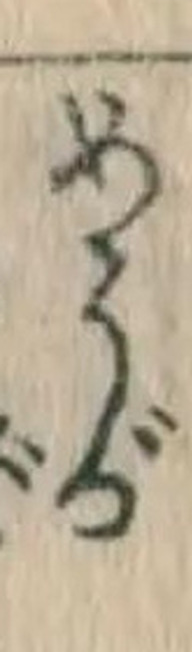せうが
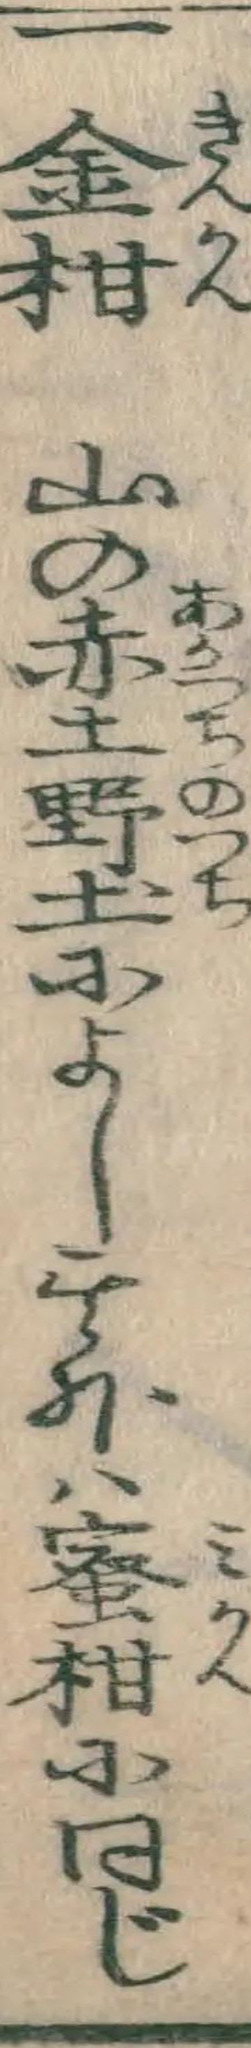一金柑山の赤土野土によし其外は蜜柑に同じ

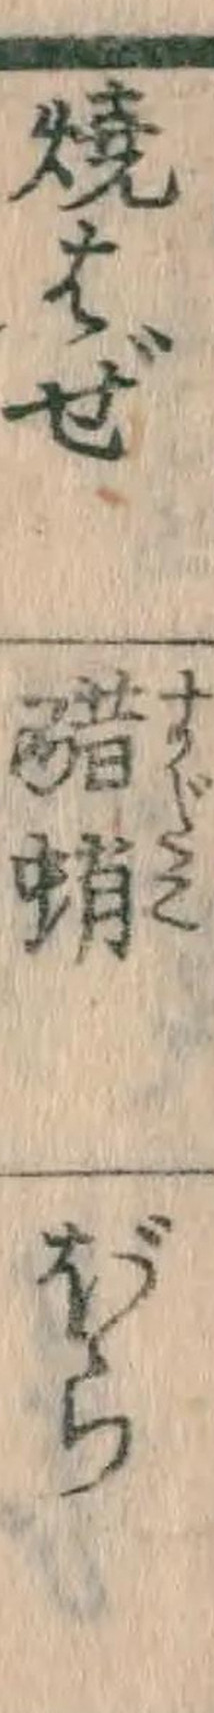焼はぜ醋蛸ぼら
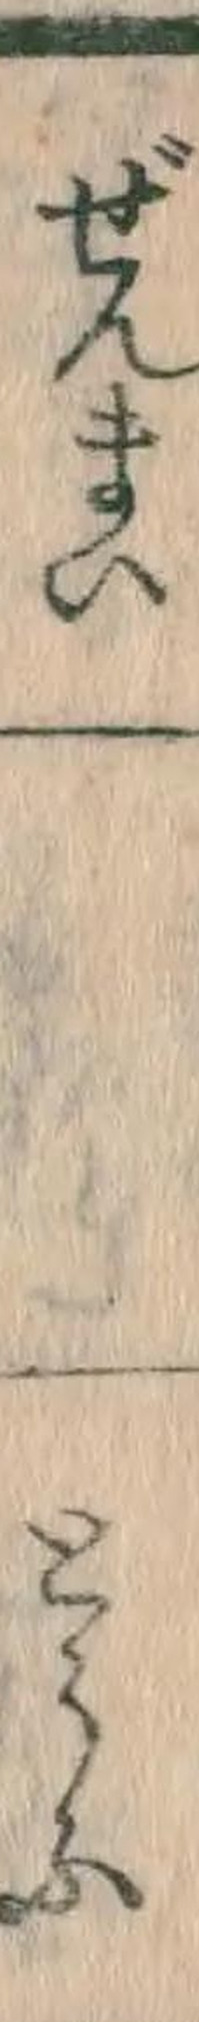ぜんまいとうふ
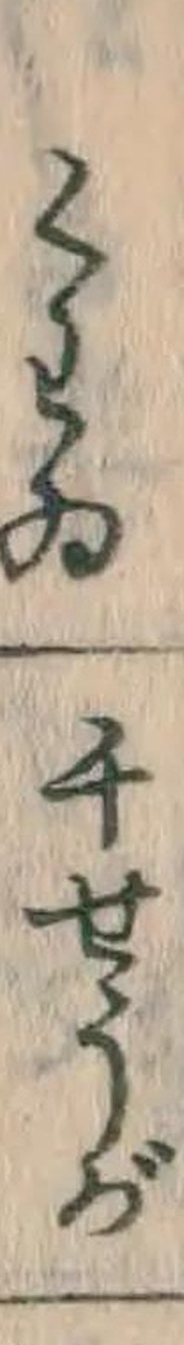くわゐ千せうが
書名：広益秘事大全 3巻. [5]
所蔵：国立国会図書館 National Diet Library, JAPAN
